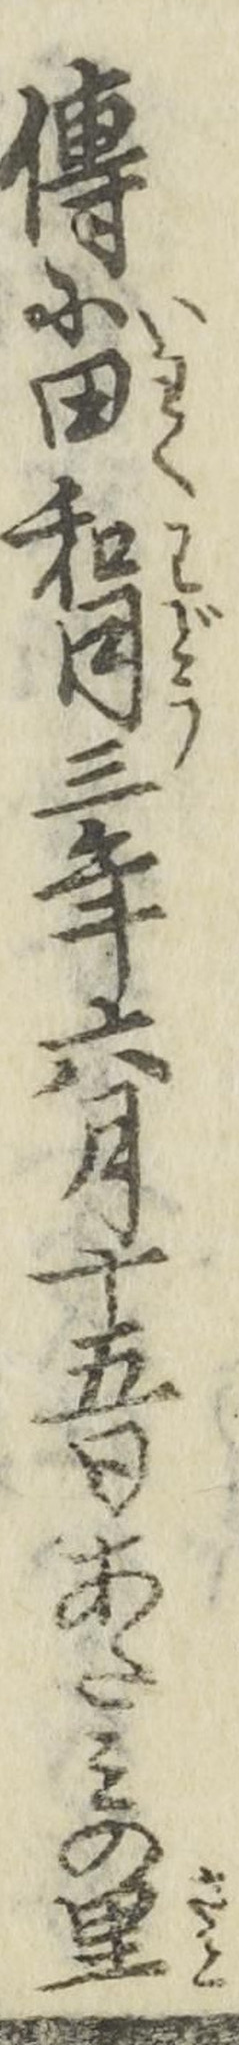伝に曰和同三年六月十五日あたみの里
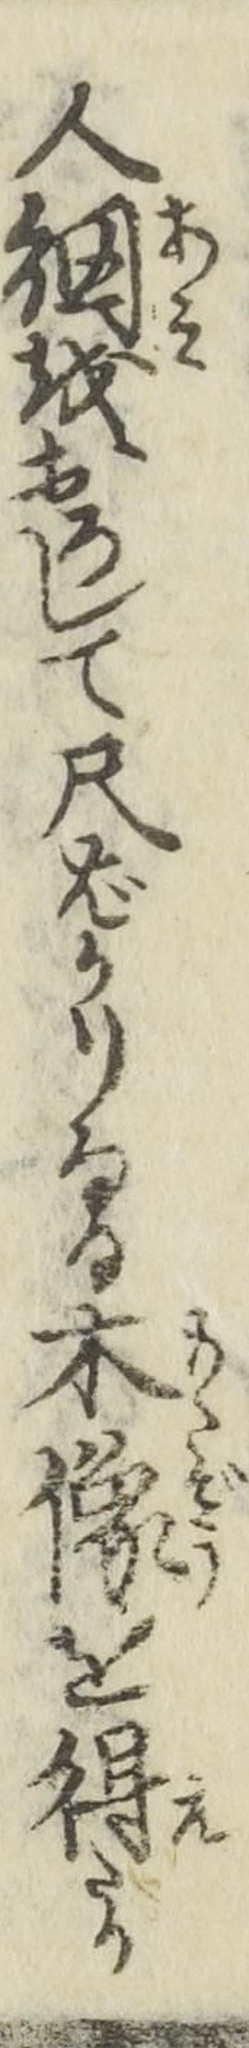人網をおろして尺ばかりなる木造を得たり
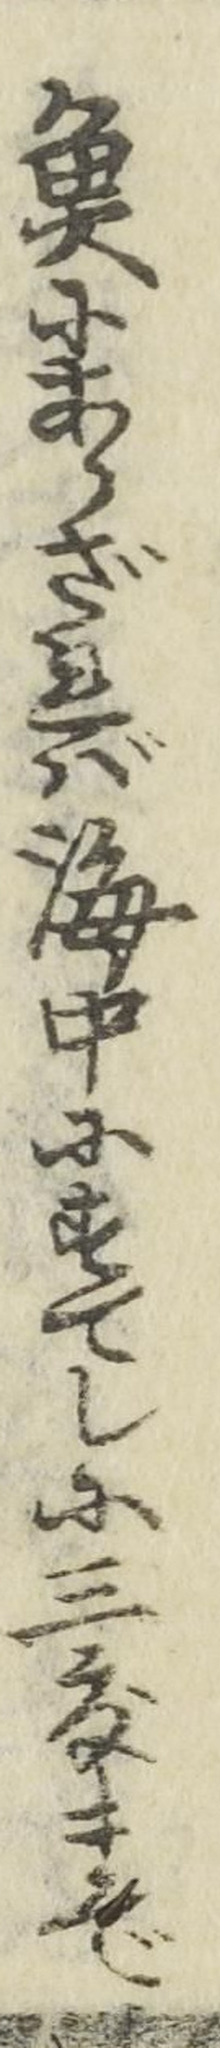魚にあらざれば海中にすてしに三度まで
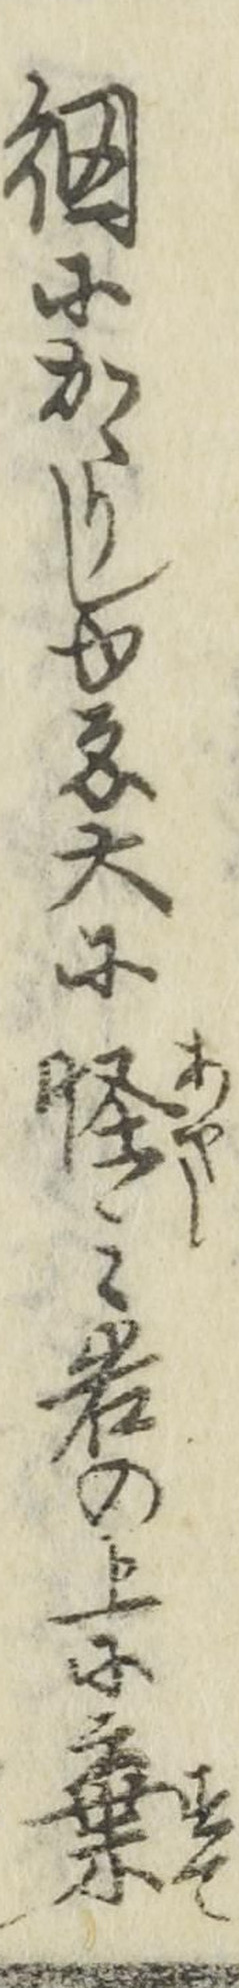網にかゝりしゆゑ大に怪み岩の上に棄
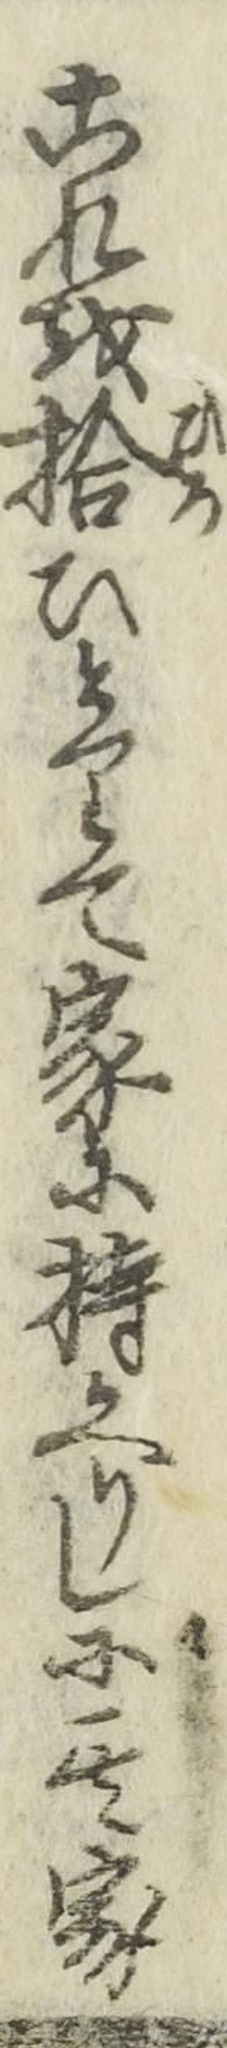これを拾ひとりて家に持かへりしに其家
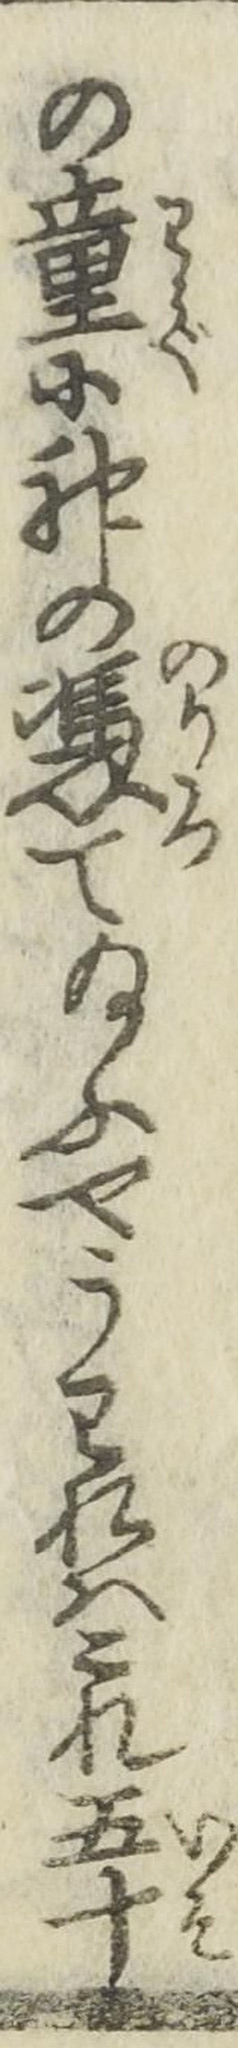の童に神の憑て給ふやうわれはこれ五十
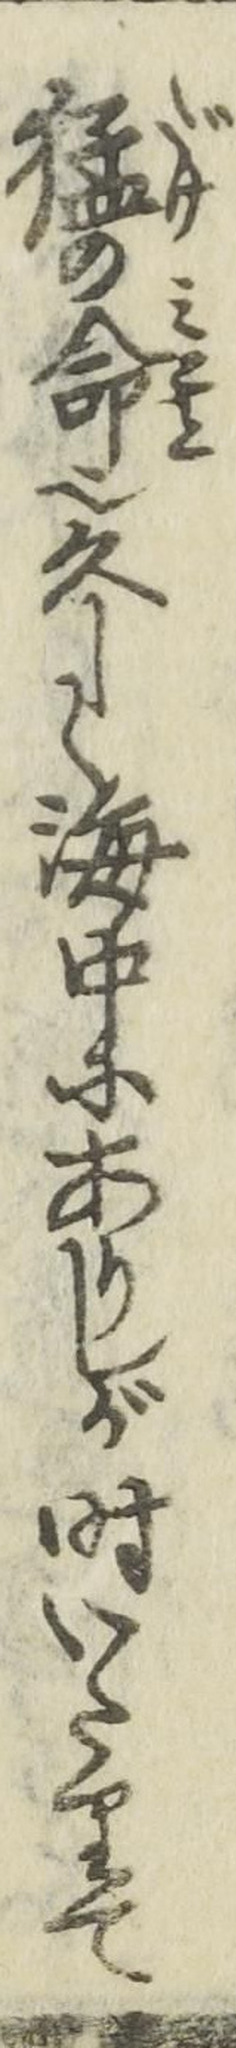猛の命也久しく海中にありしが時いたりて
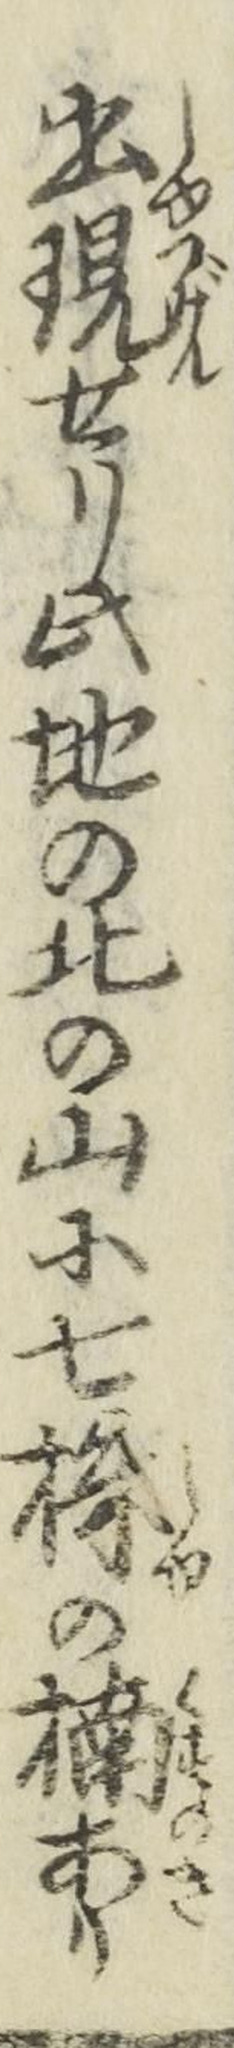出現せり此地の北の山に七株の楠あり
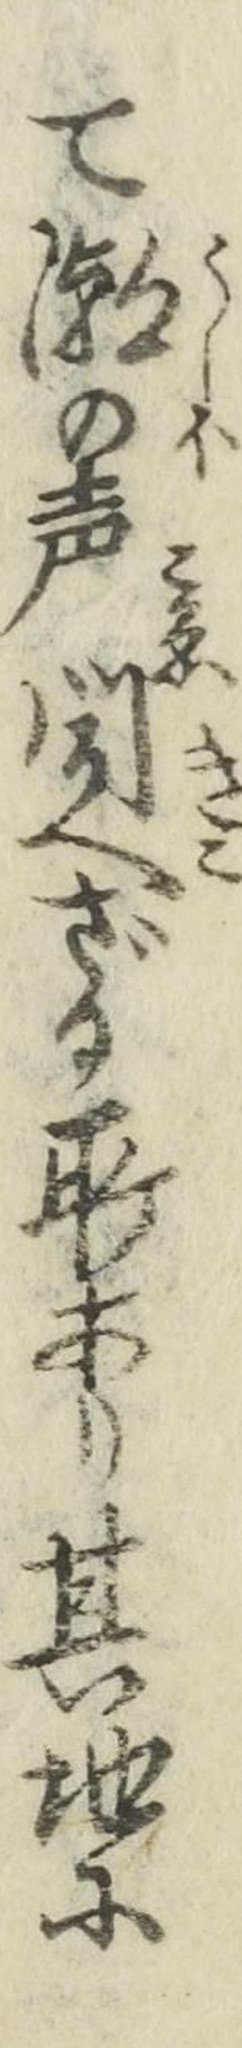て潮の声聞へざる所あり其地に
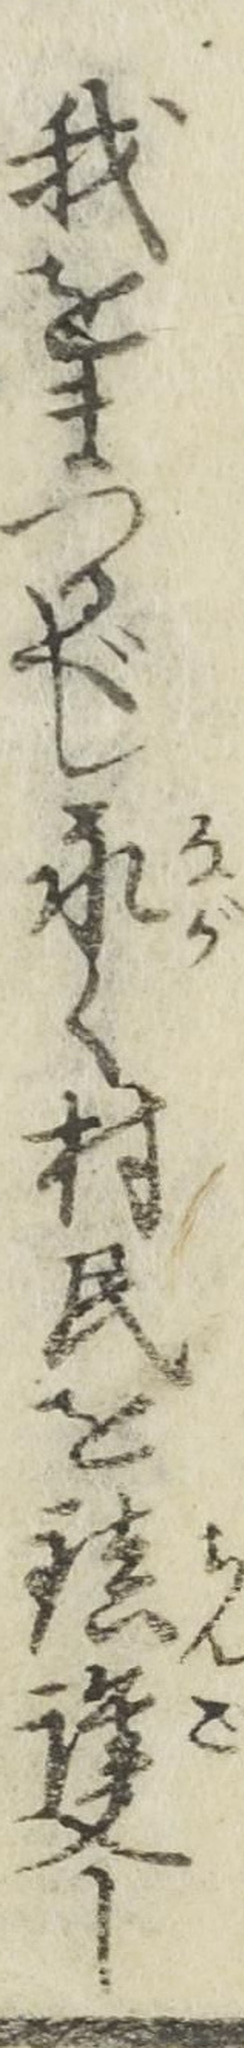我をまつるべし永く村民を鎮護し
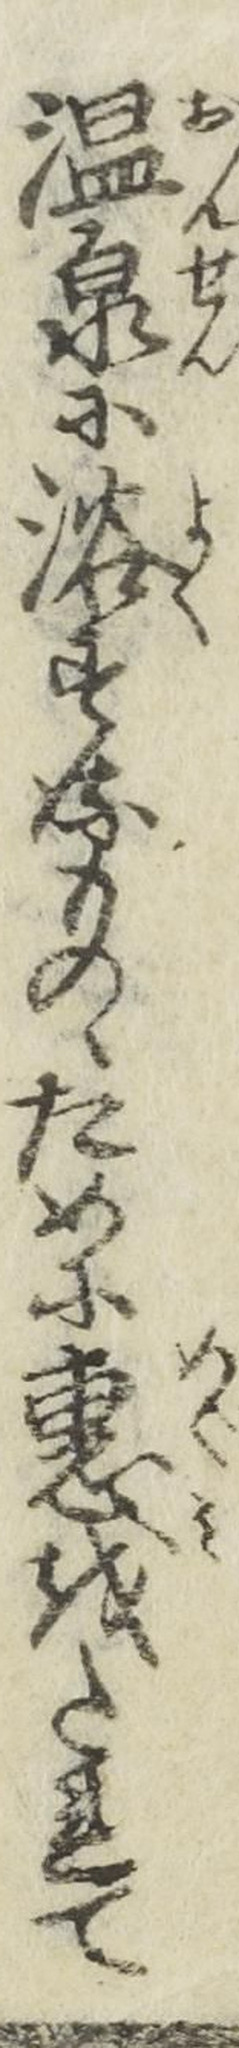温泉に浴するものゝために恵をたれて
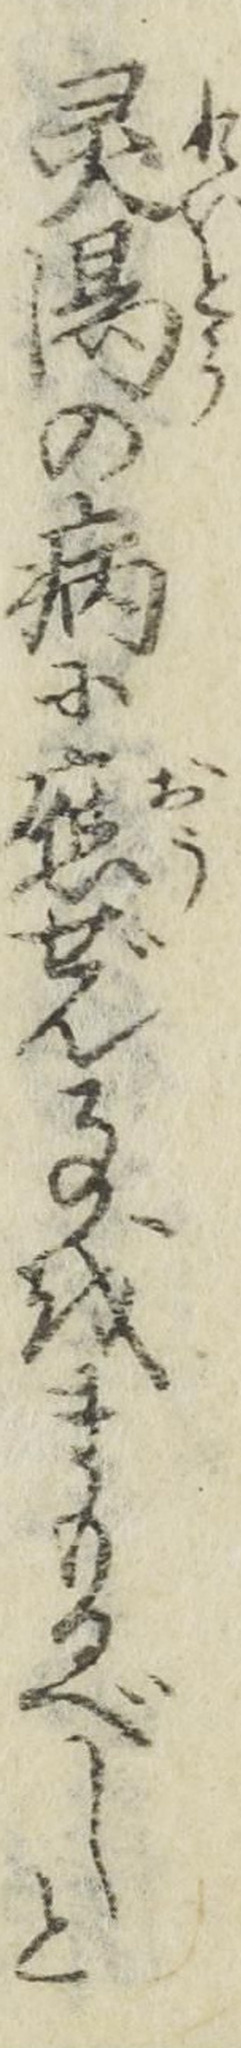霊湯の病に応ぜん事をまもるべしと
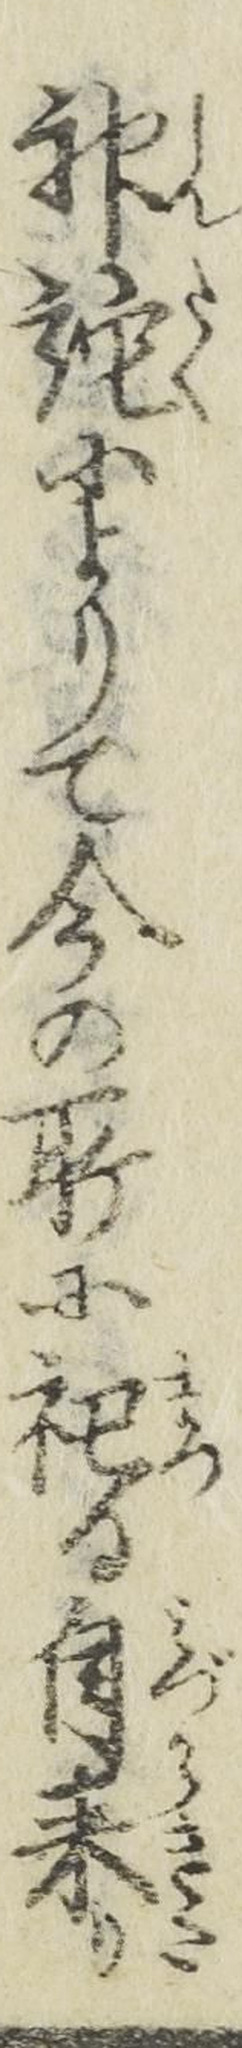神託によりて今の所に祀る自来り
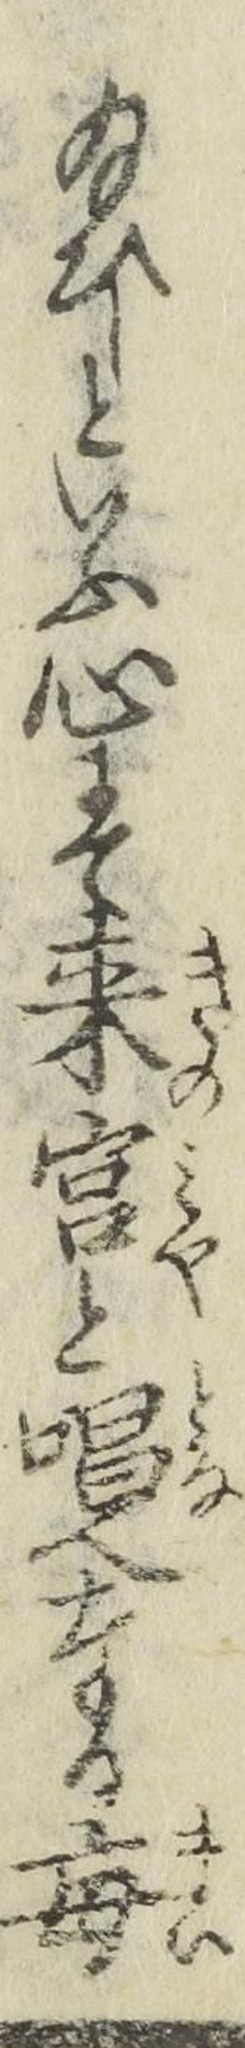給ひしといふ心にて来宮と唱へたる毎
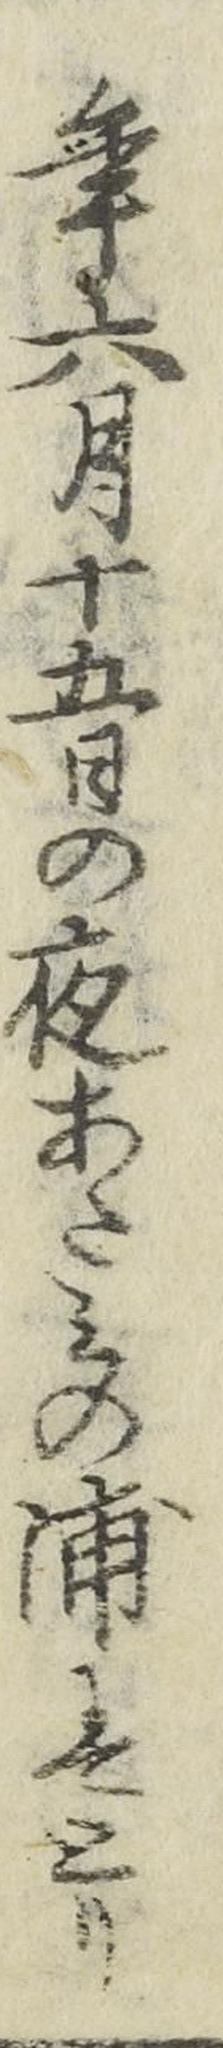年六月十五日の夜あたみの浦にてとり
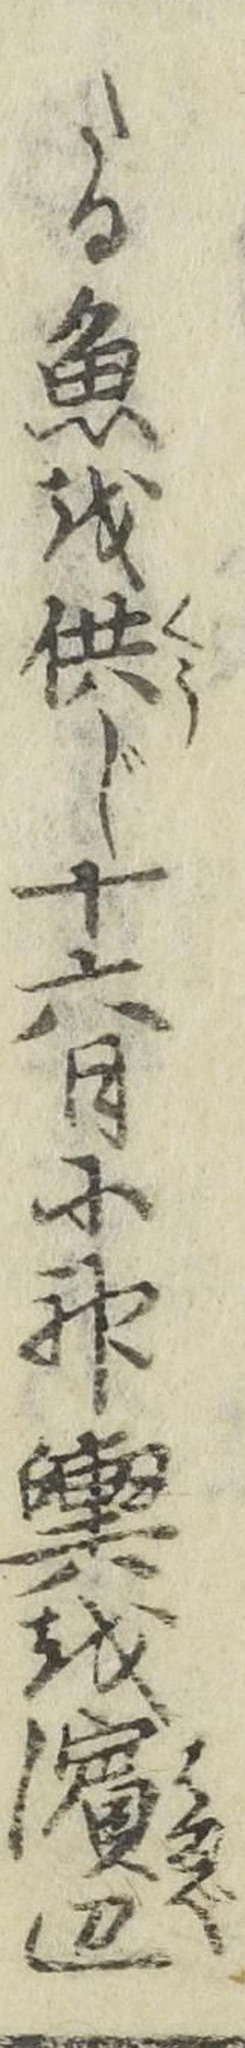たる魚を供じ十六日に神輿を浜辺
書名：熱海温泉圖彙
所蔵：東京大学地震研究所図書室 Earthquake Research Institute Library, The University of Tokyo, JAPAN
